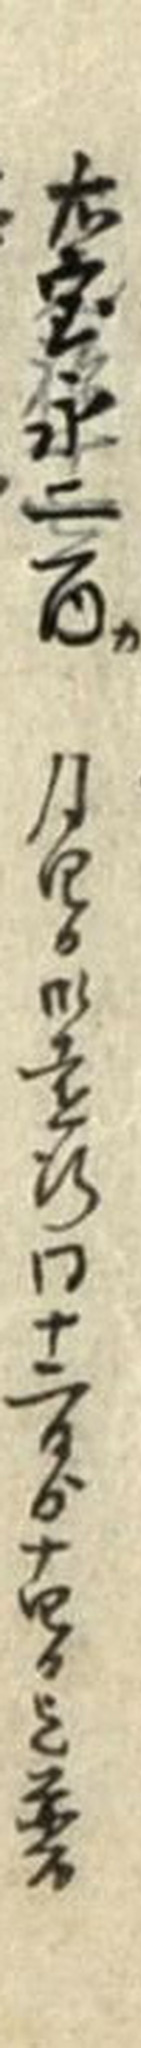右宝永二酉ヵ月四日御遠行同十二日ゟ十四日迄普
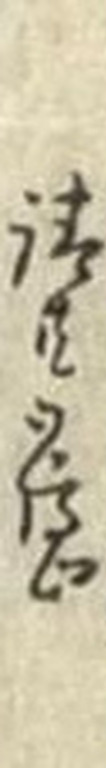請共御停止
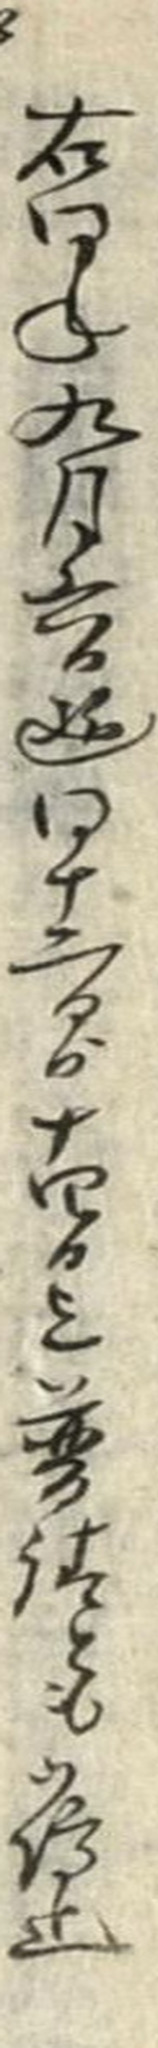右同年九月六日逝同十二日ゟ十四日迄普請とも御停止
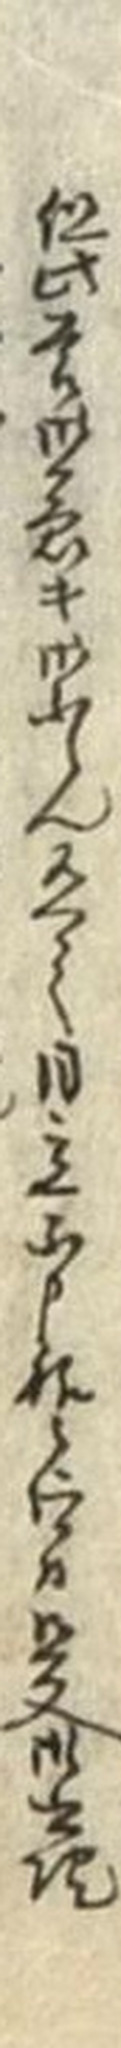但此節御急キ御ふしん有之目立不申候様被仰付且又御書院
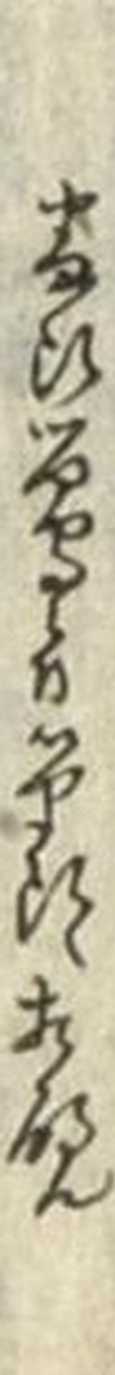番頭留守に付筆頭へ相触ル
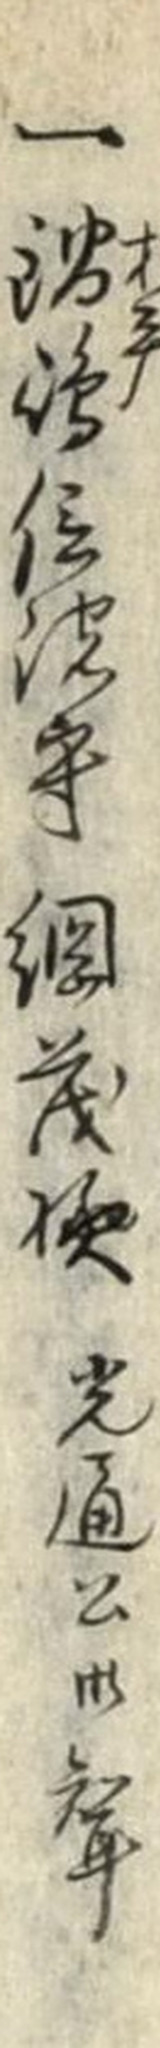一鍋島信濃守綱茂様光通公御聟
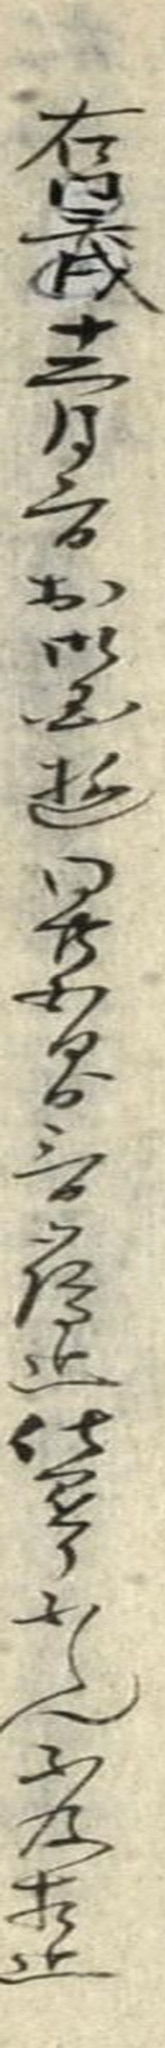右同三戌十二月二日於御国逝同廿五日ゟ三日御停止仕懸りふしん不及相止
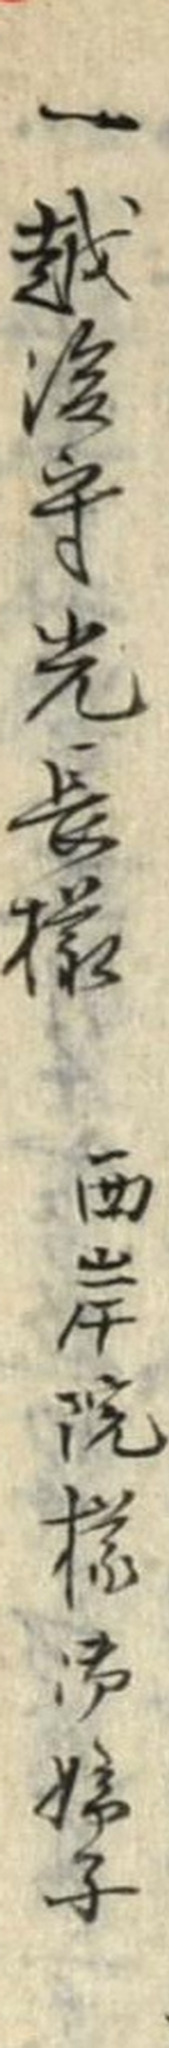一越後守光長様西岸院様御嫡子

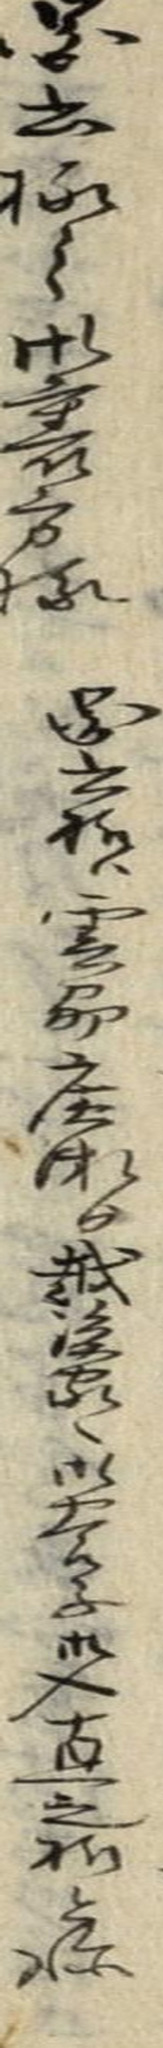一図書様之御裏方様図書様は雲州広瀬ゟ越後家へ御養子御入直之様と称
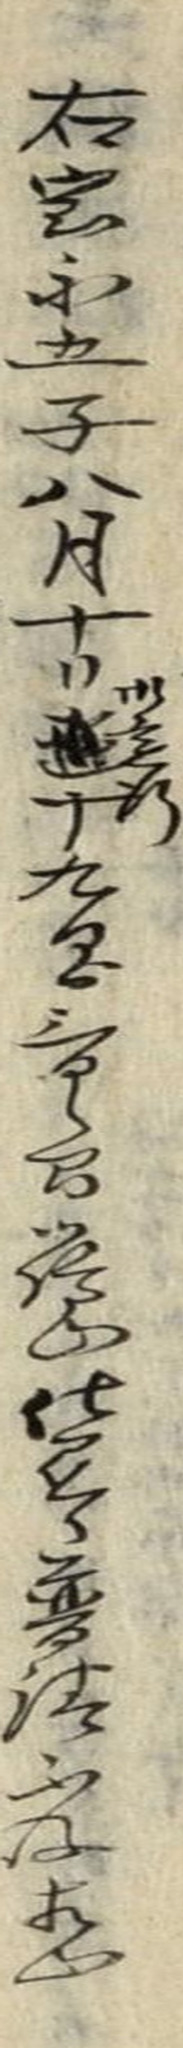右宝永五子八月十日逝御遠行十九日ゟ三日之間御停止仕懸り普請不及相止
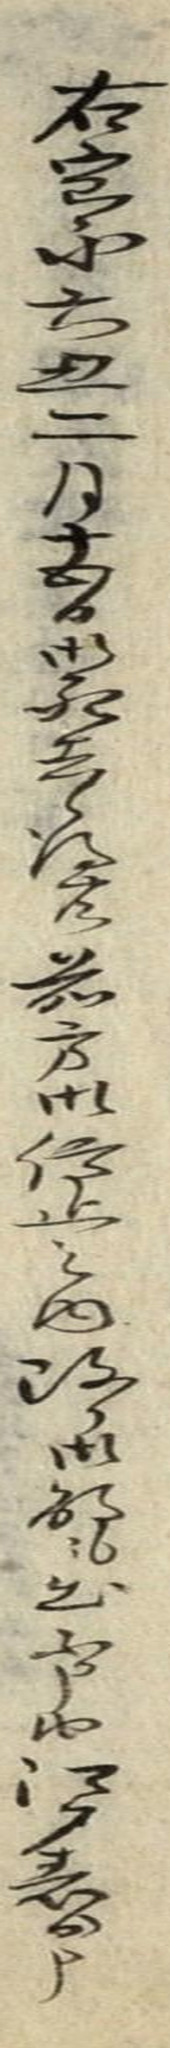右宝永六丑二月十五日御死去候得共前方御停止之内改り御触も出不申由江戸表ゟ申
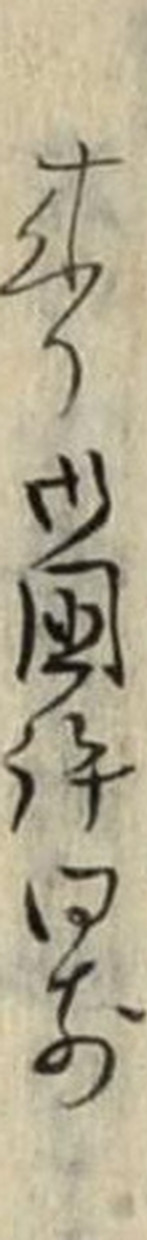来り御国許同前
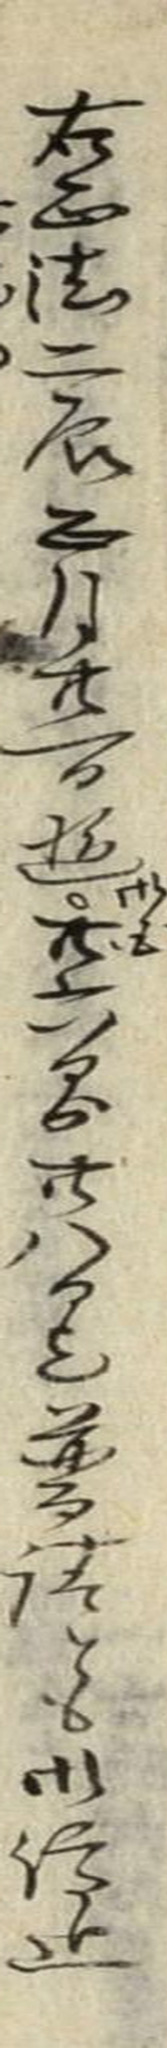右正徳二辰正月廿一日逝◦廿御国六日ゟ廿八日迄普請とも御停止
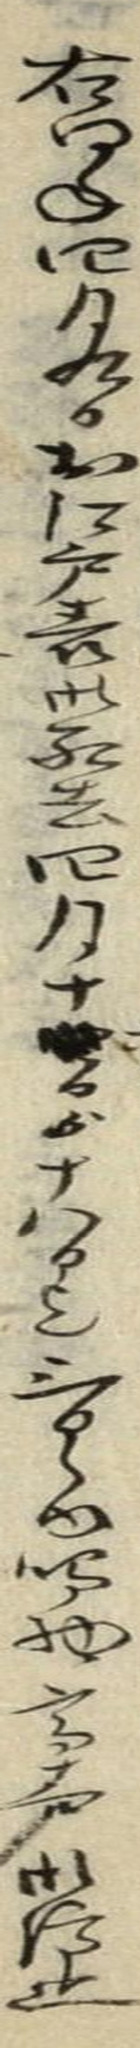右同年四月九日於江戸表御死去四月十六日ゟ十八日迄三日之内鳴物高声御停止
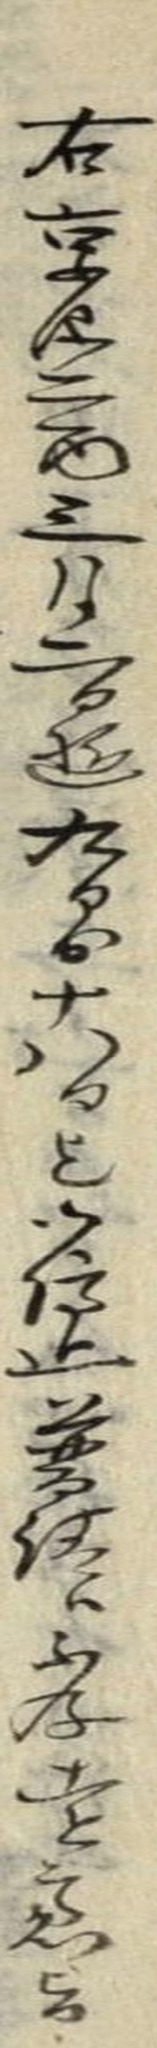右享保二酉三月二日逝九日ゟ十八日迄御停止普請は不及遠慮旨
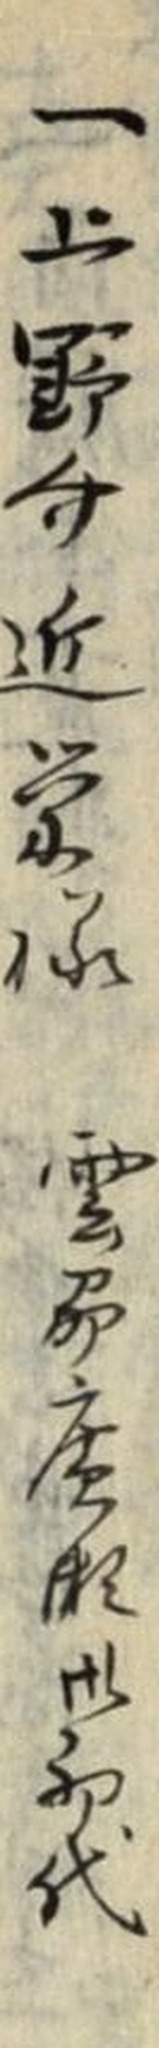一上野介近栄様雲州広瀬御初代
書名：御停止異変死失
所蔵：福井県文書館 Fukui Prefectural Archives
